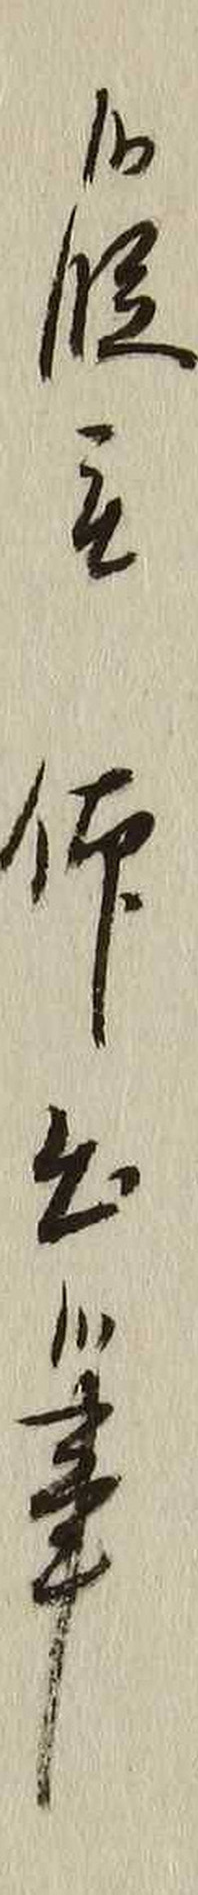候段被仰出候事
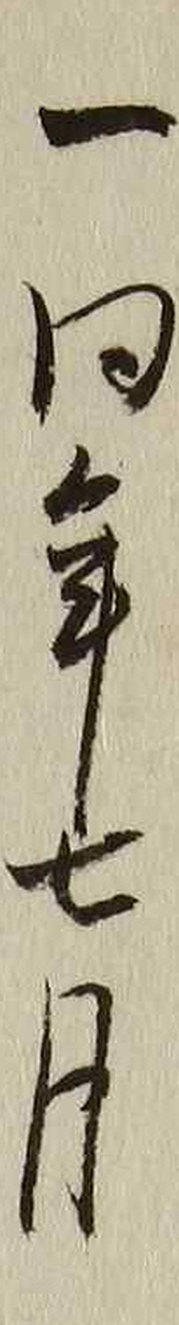一同年七月
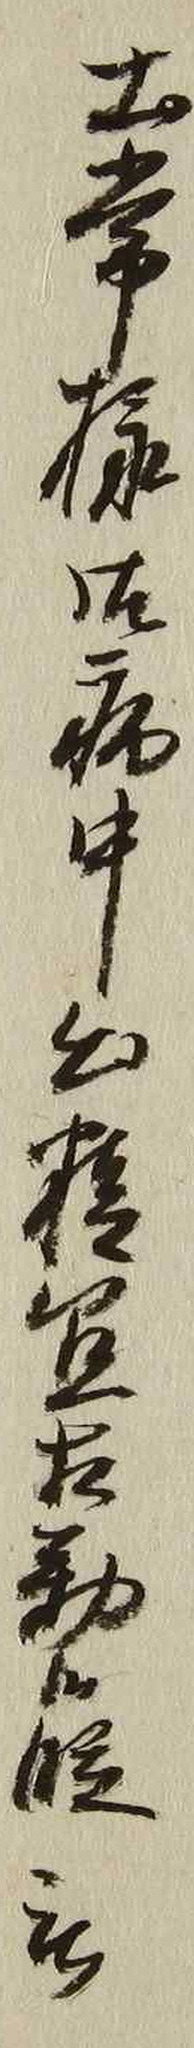土常様御病中出精宜相勤候段被
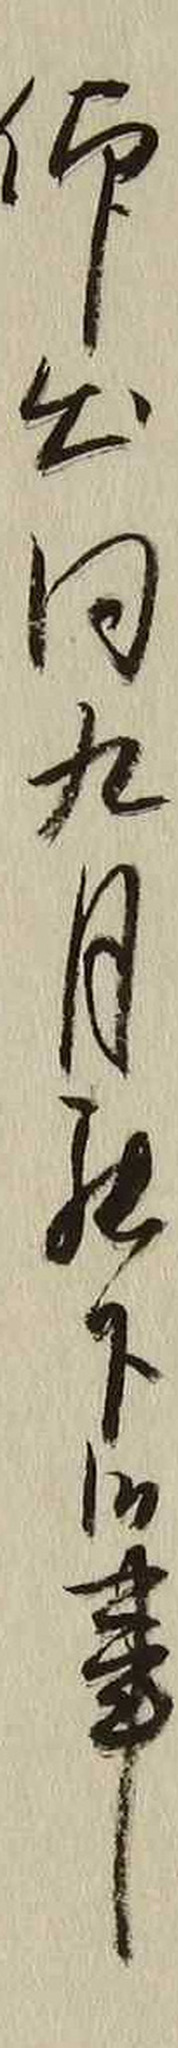仰出同九月罷下候事
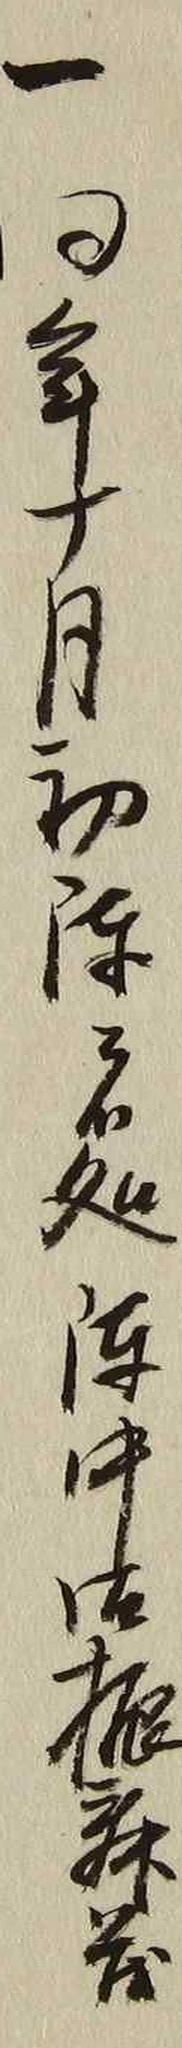一同年十月初陣ニ候処陣中御振舞茂
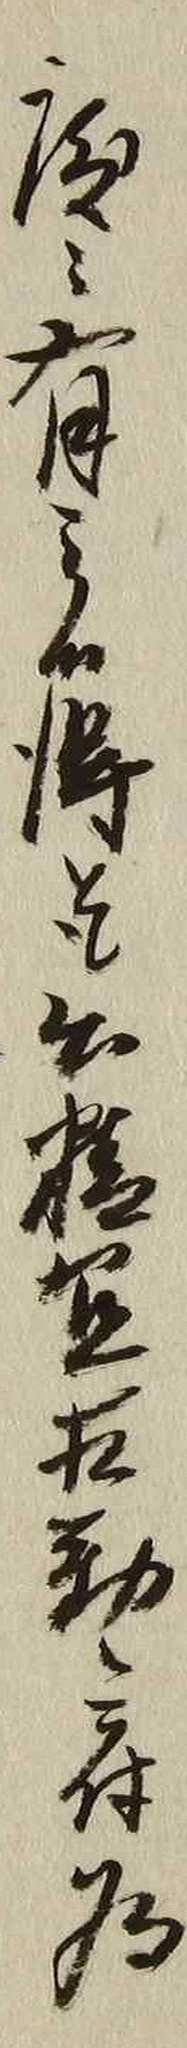度々有之候得とも出精宜相勤候ニ付為
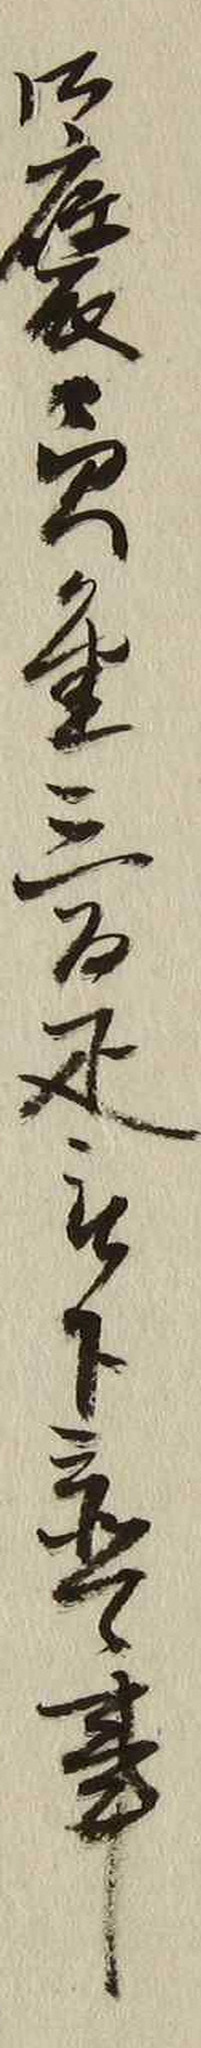御褒美金三百疋被下置候事
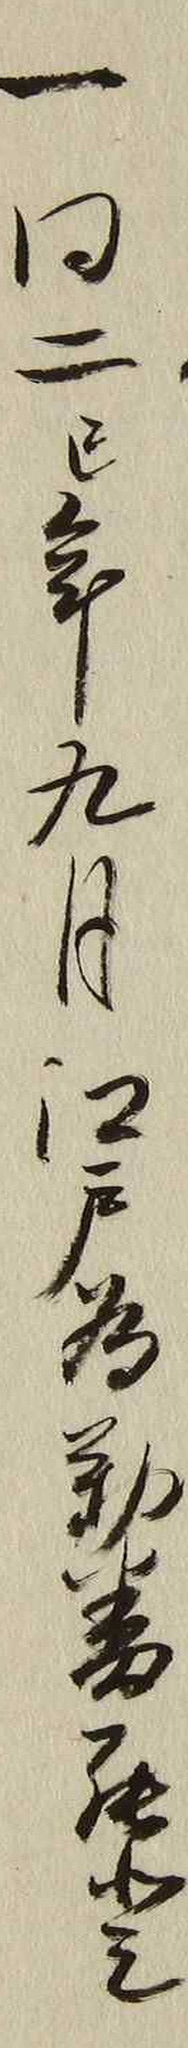一同二巳年九月江戸為勤番罷登
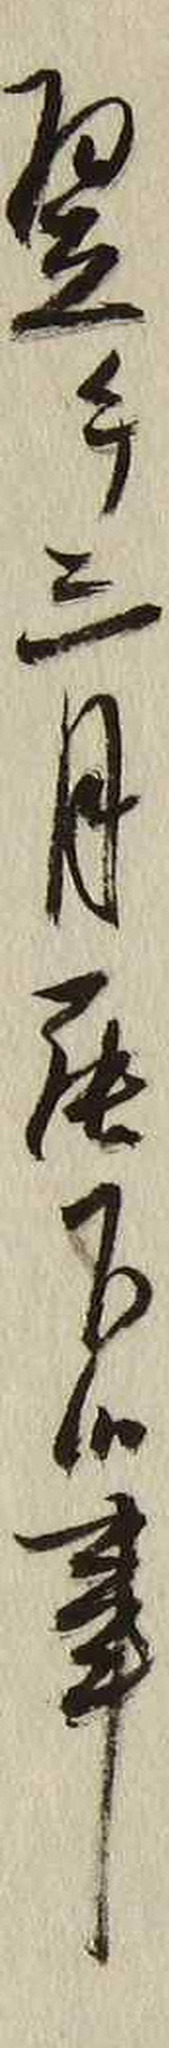翌午三月罷下候事
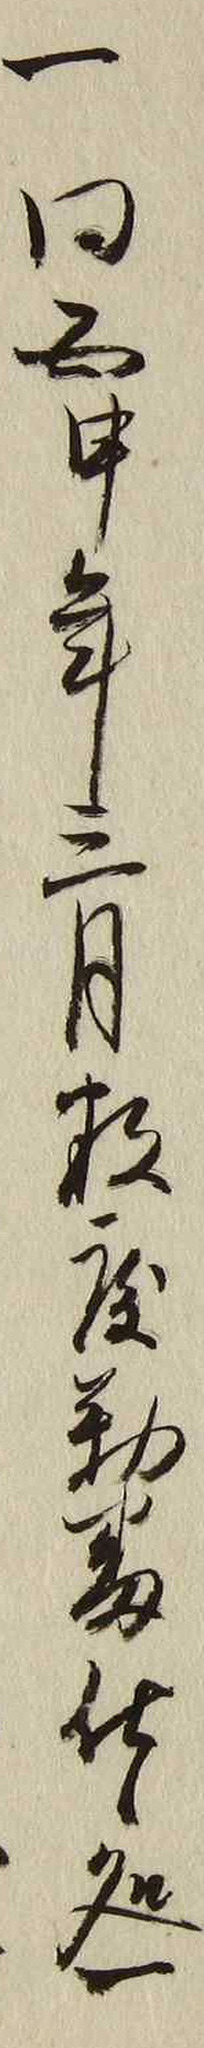一同五申年三月数度勤番仕候処一
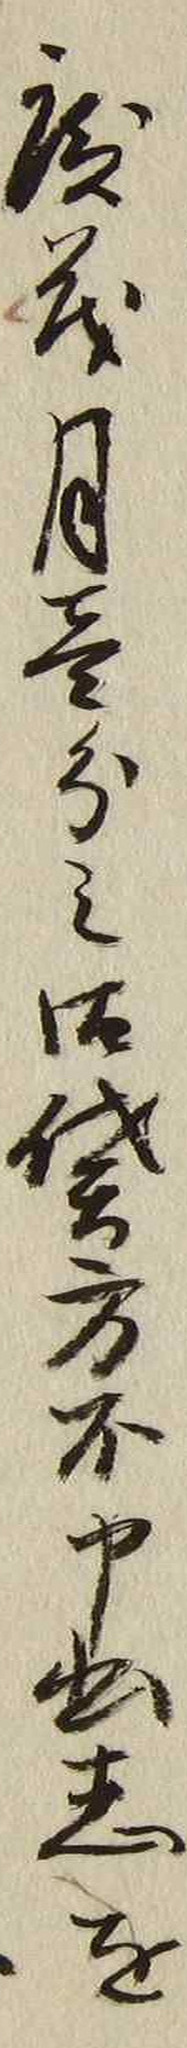度茂月壱分之御貸方不申出志を
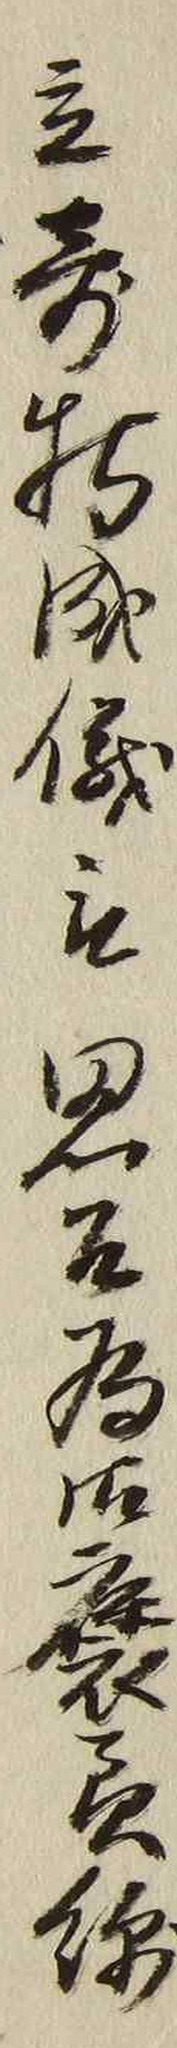立奇特成儀被思召為御褒美綿
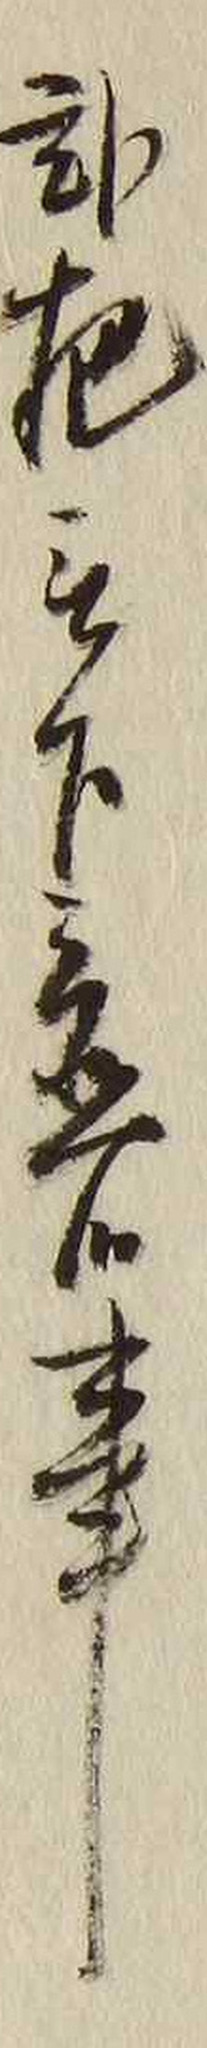弐把被下置候事

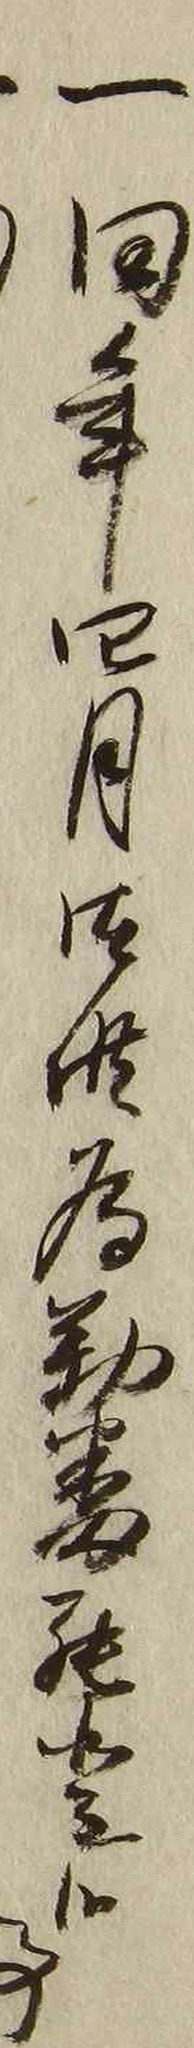一同年四月御供為勤番罷登候事
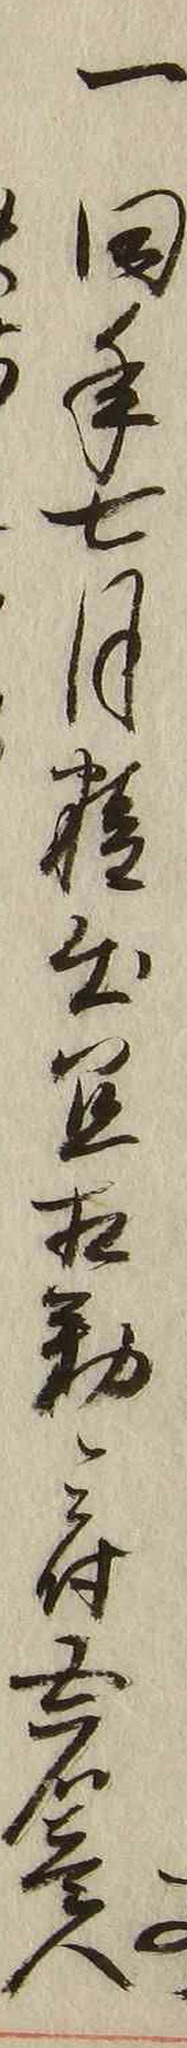一同年七月精出宜相勤候ニ付五石壱人
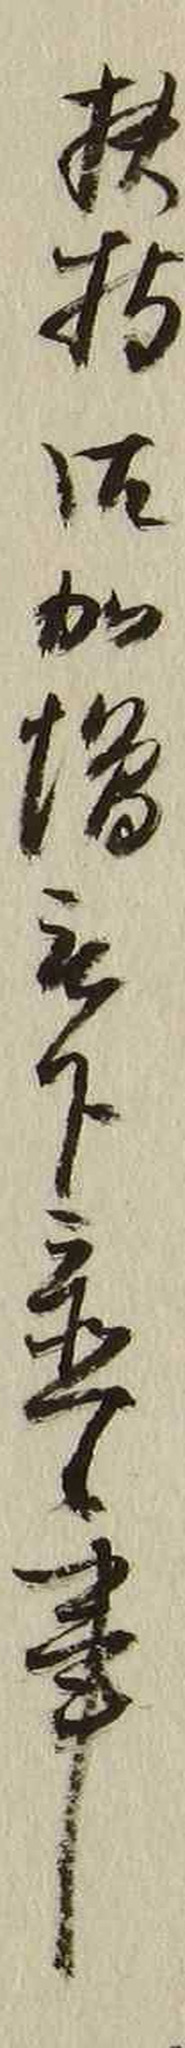扶持御加増被下置候事
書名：諸士系譜　巻之349　も之部5
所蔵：会津若松市立会津図書館
